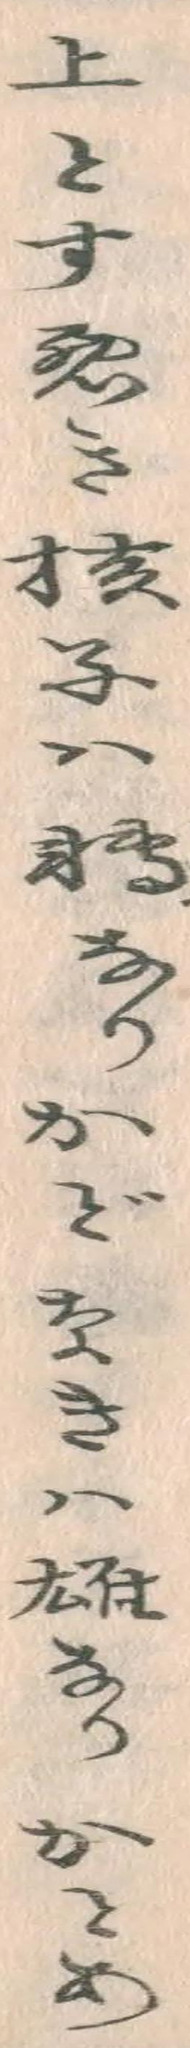上とす悪き核子は転なりかどなきは雄なりかとあ
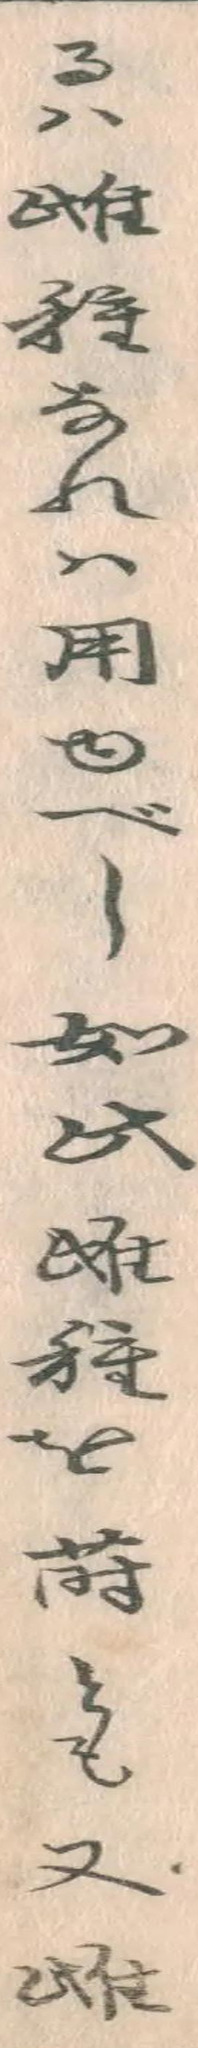るは雌種なれは用ゆべし如此雌種を蒔とも又雌
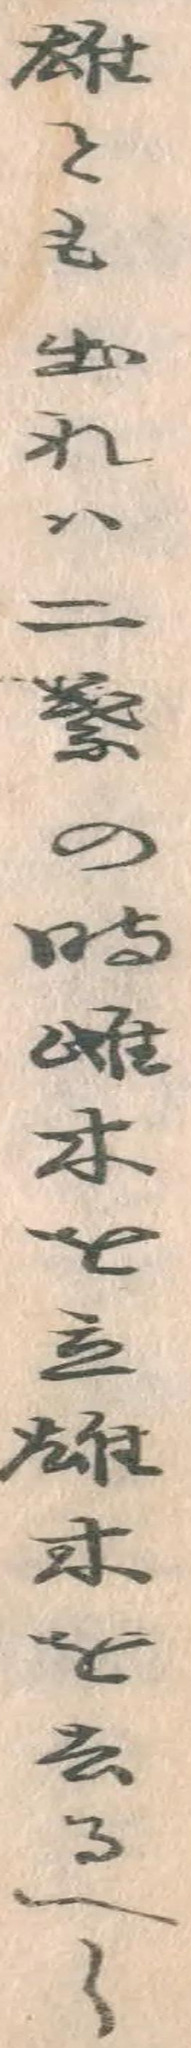雄とも出れば二葉の時雌木を立雄木を去るへし
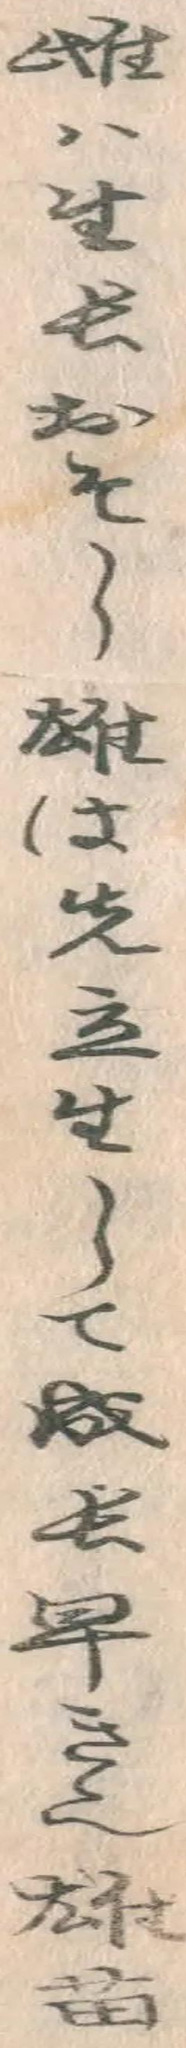雌は生長おそし雄は先立生して成長早き也雄苗
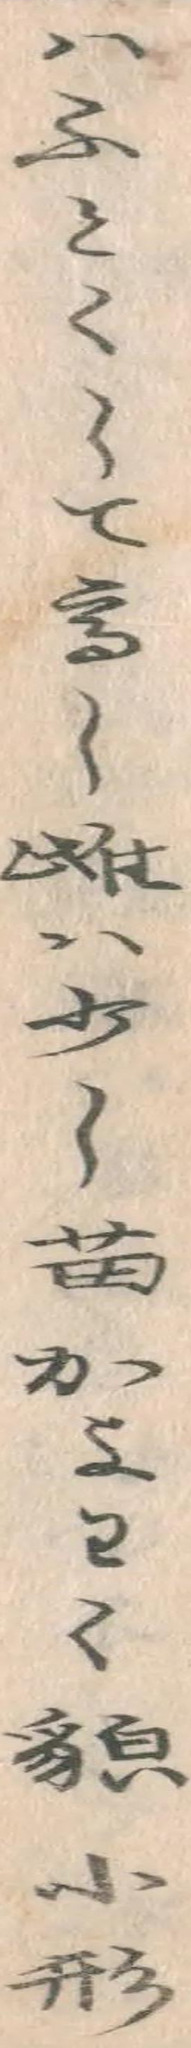はふとくして高し雌は少し苗かよわく貌小形
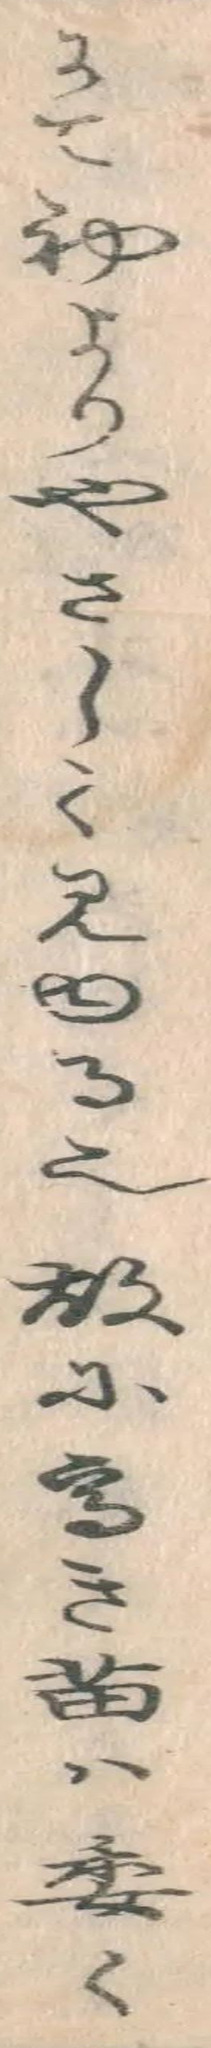にて初よりやさしく見ゆる也故に高き苗は委く

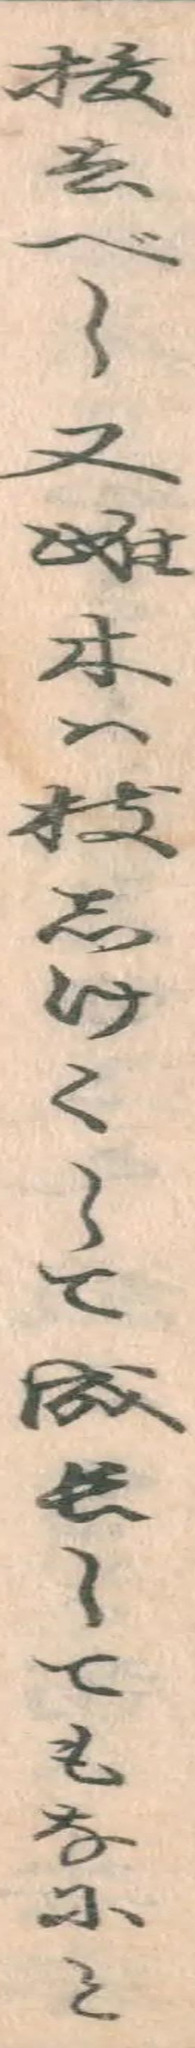抜去べし又雌木は枝しけくして成長してもなにと
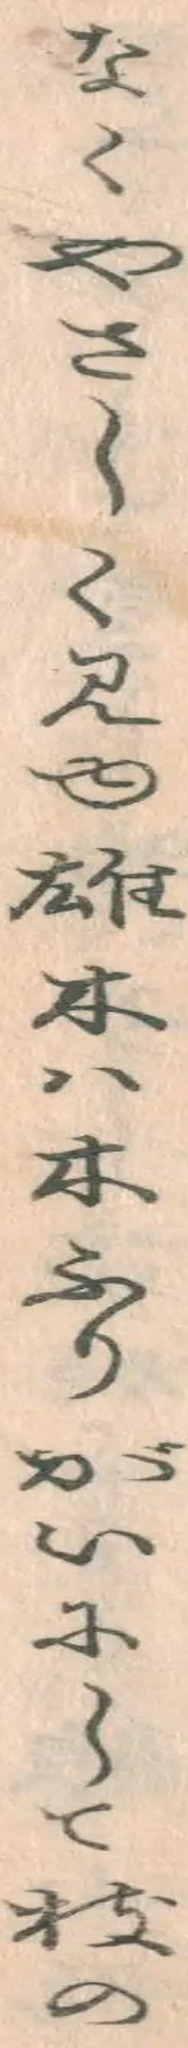なくやさしく見ゆ雄木は木ふりがいにして枝の
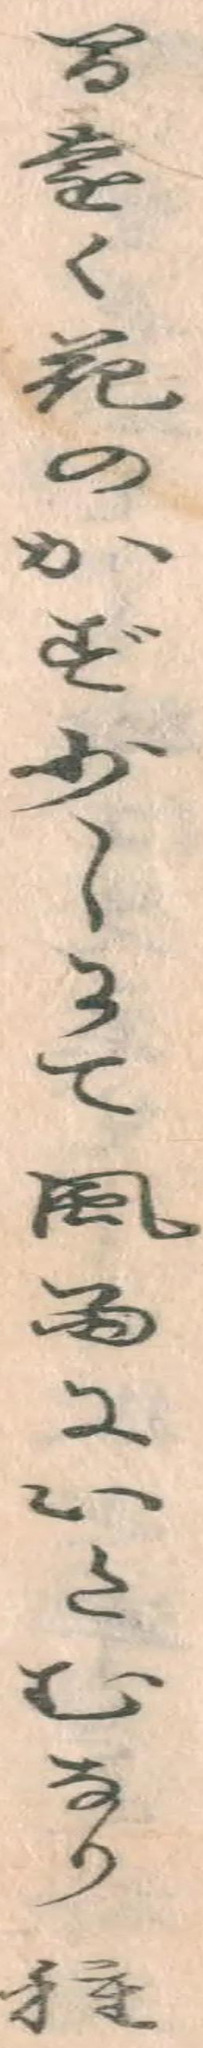間遠く花のかず少しにて風雨にいたむなり種
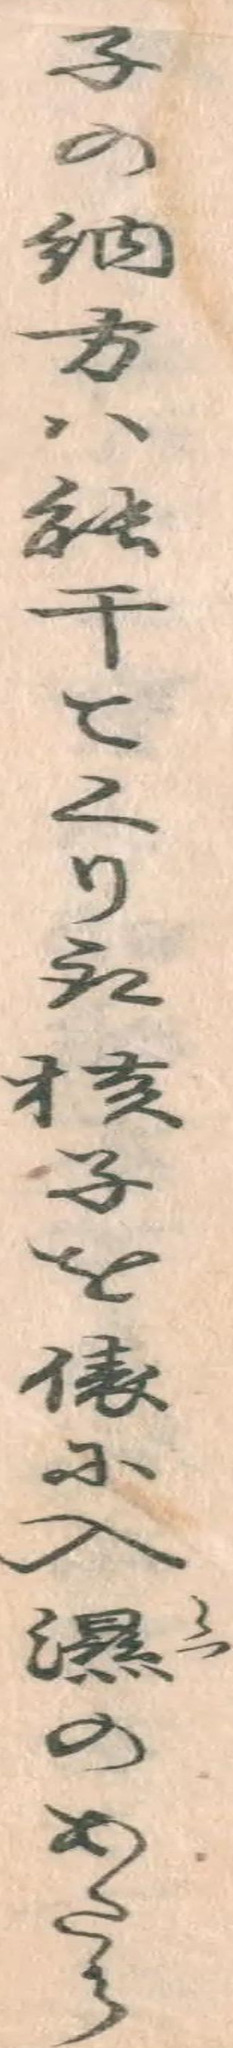子の納方は能干てくり取核子を俵に入湿のあたら
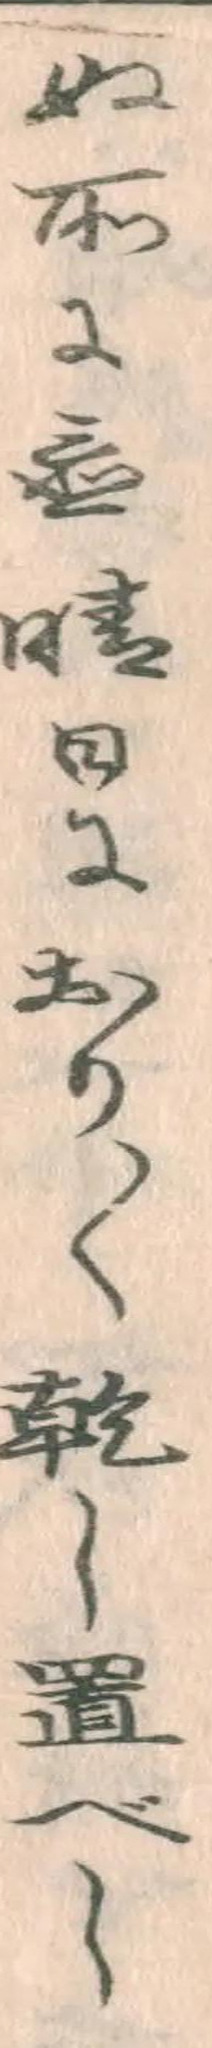ぬ所に置晴日におり〳〵乾し置べし
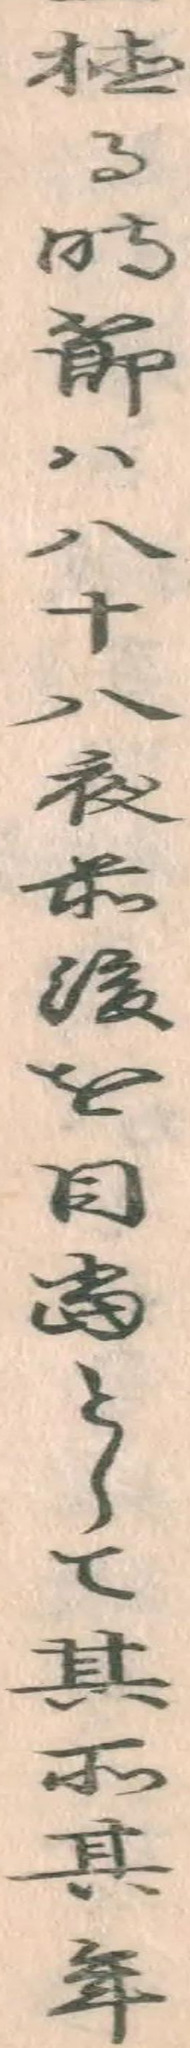一植る時節は八十八夜前後を目当として其所其年
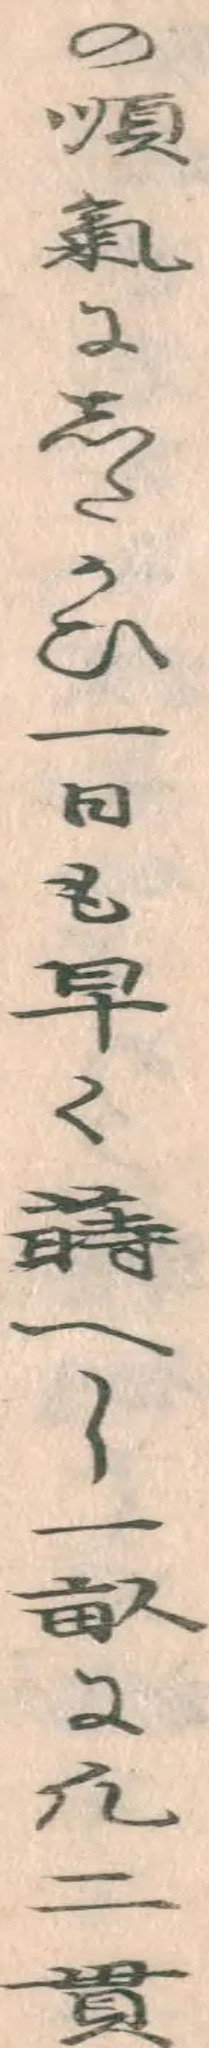の順気にしたかひ一日も早く蒔へし一畝に凡二貫
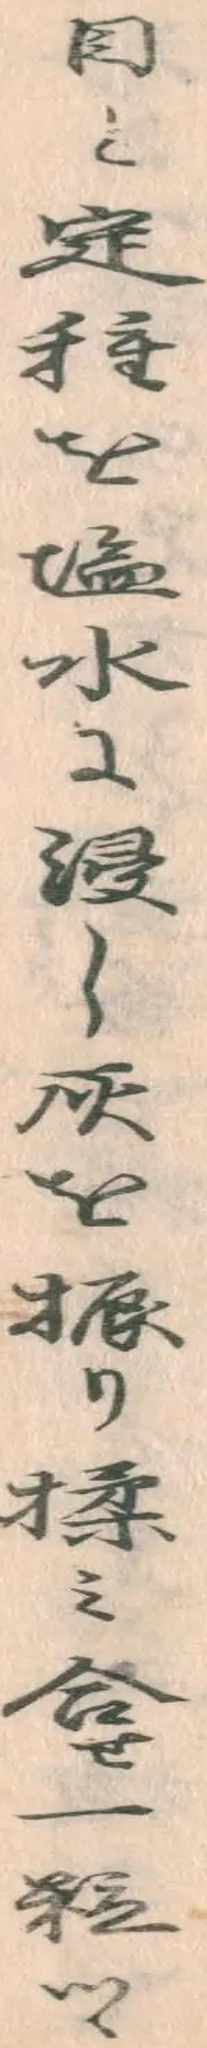目と定種を塩水に浸し灰を振り揉み合せ一粒つゝ
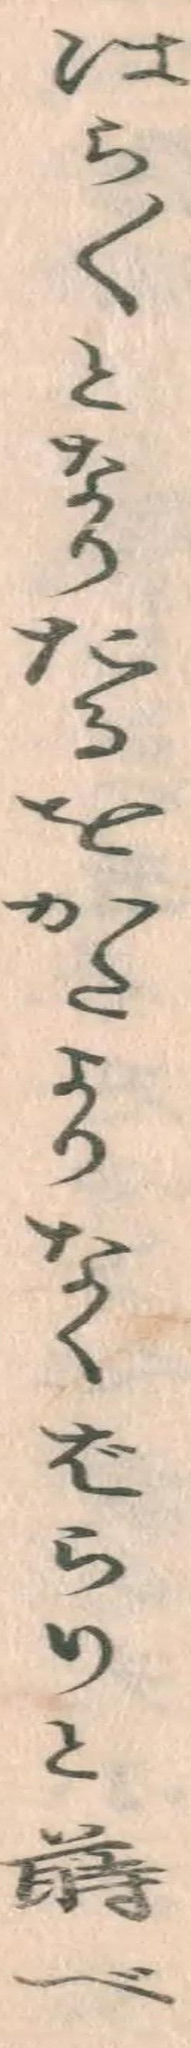はら〳〵となりたるをかたよりなくばらりと蒔べ
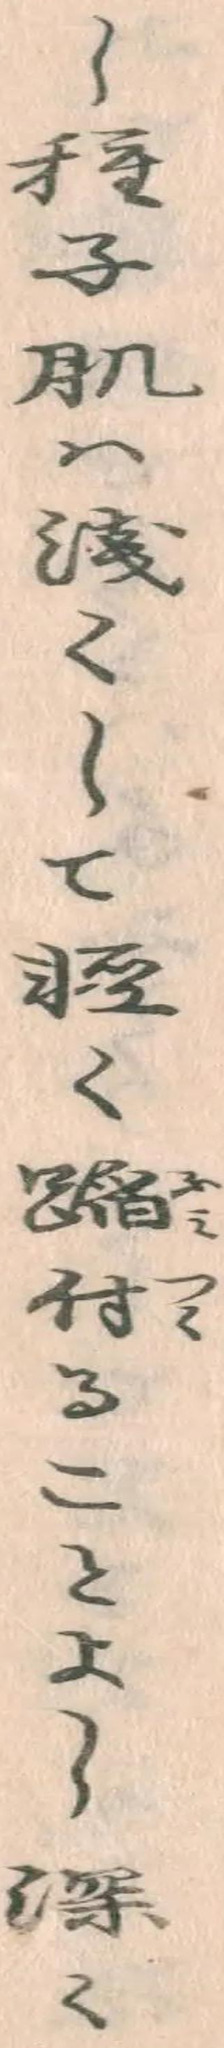し種子肌は浅くして軽く蹈付ることよし深く
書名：機織彙編 5巻. [1]
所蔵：国立国会図書館 National Diet Library, JAPAN
